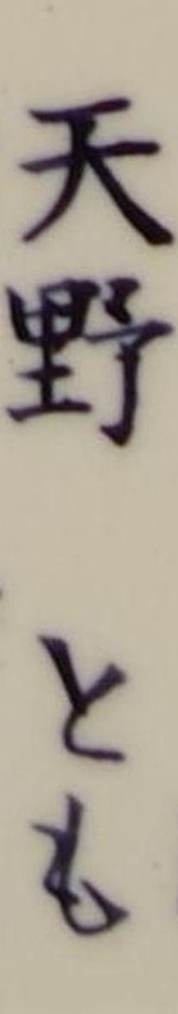天野とも
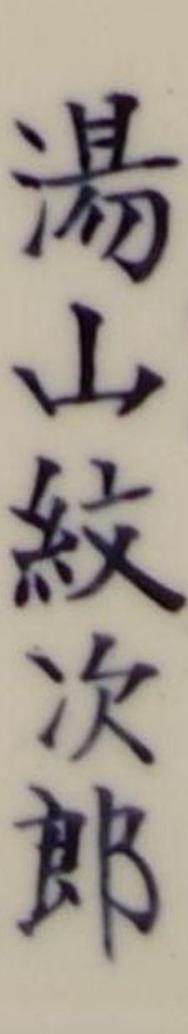湯山紋次郎
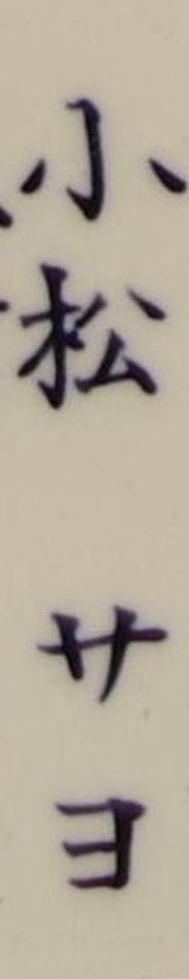小松サヨ
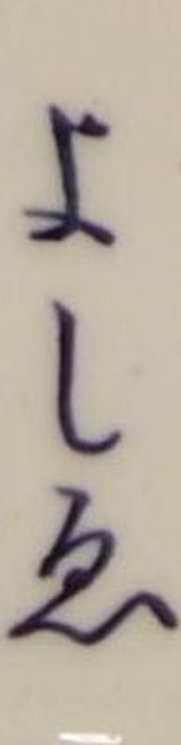よしゑ
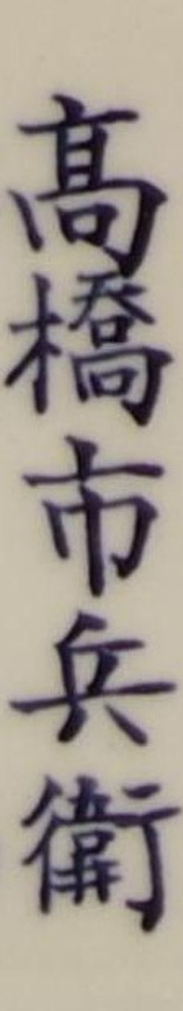高橋市兵衛
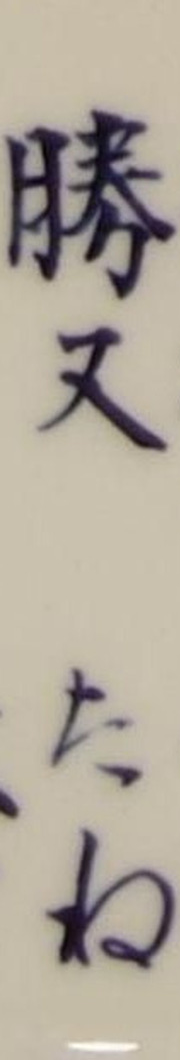勝又たね
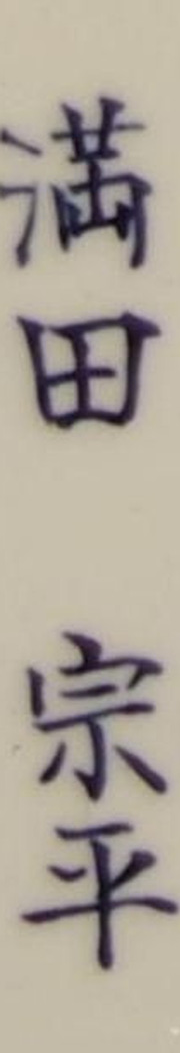満田宗平
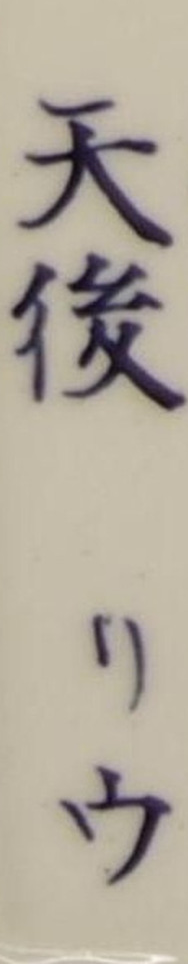天後リウ

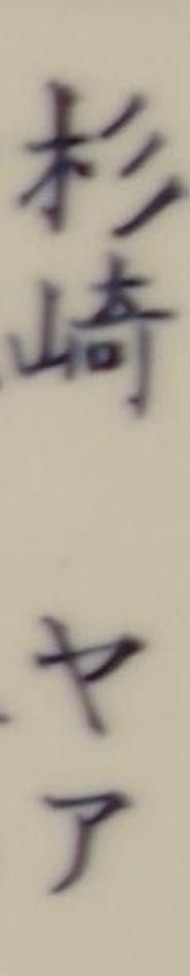杉崎ヤア
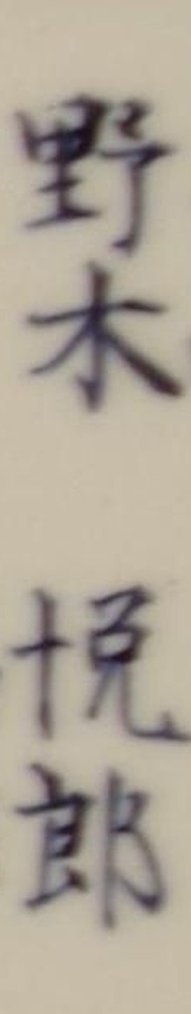野木悦郎
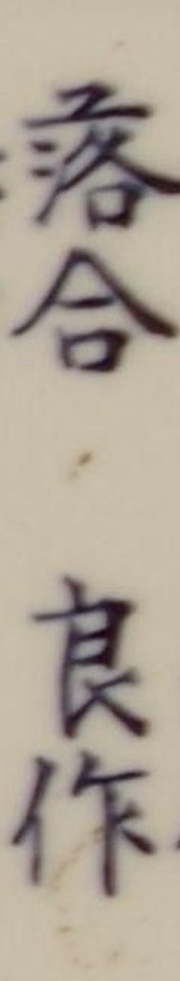落合良作
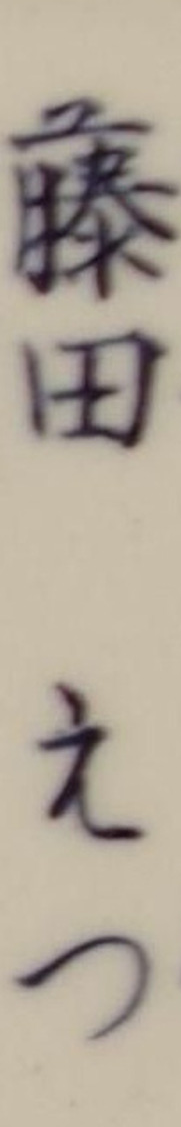藤田えつ
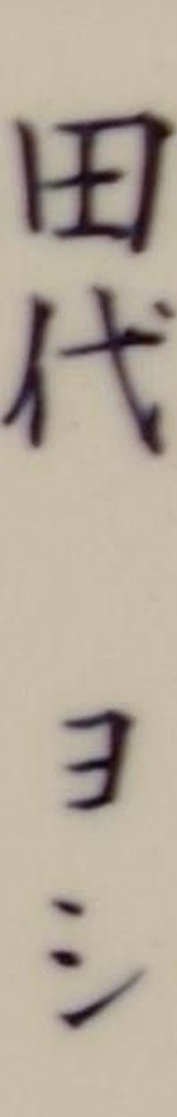田代ヨシ
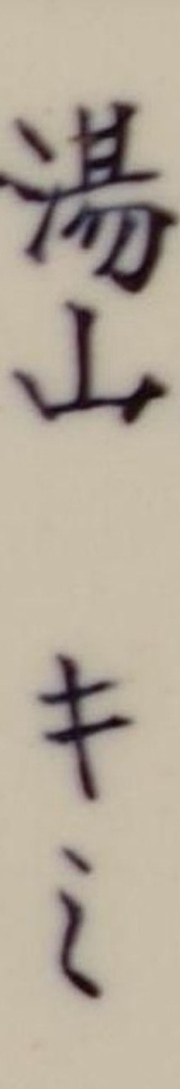湯山キミ
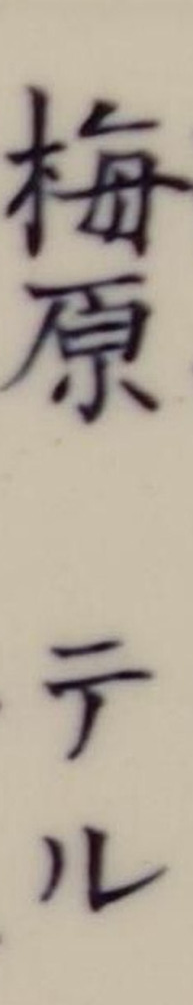梅原テル
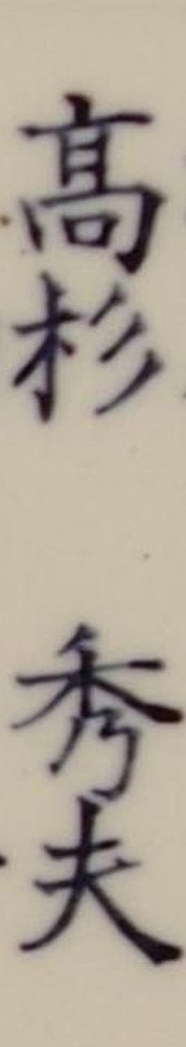高杉秀夫
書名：E~L
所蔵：高野山金剛峯寺
